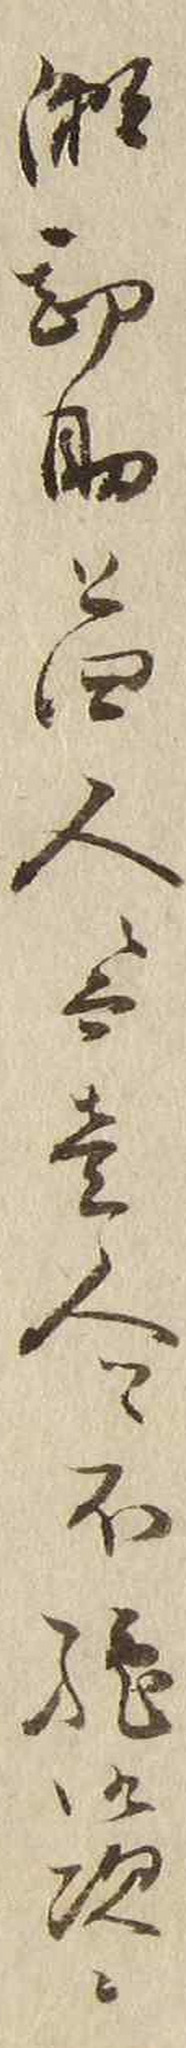瀬勘助と四人ニ而壱人ツヽ不絶御次ニ

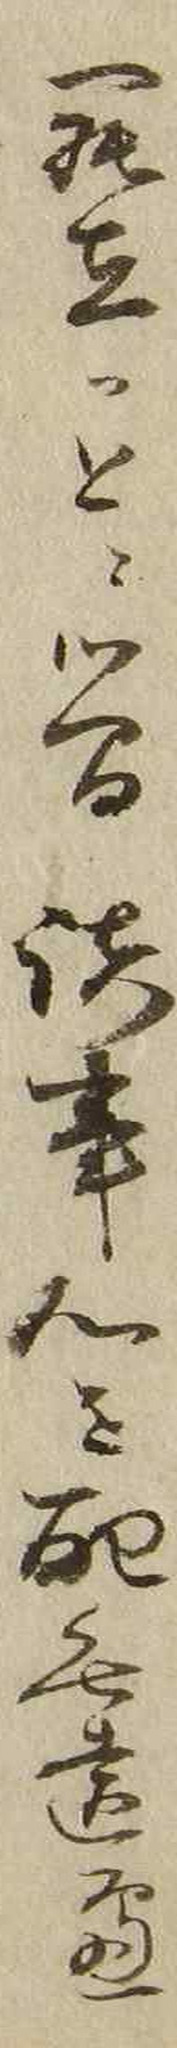罷在候とニ候間諸事心を配無遠慮
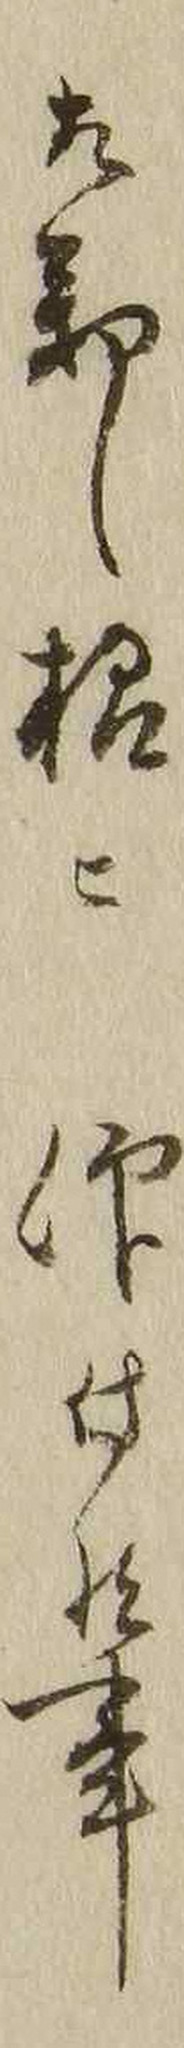相勤候様被仰付候事
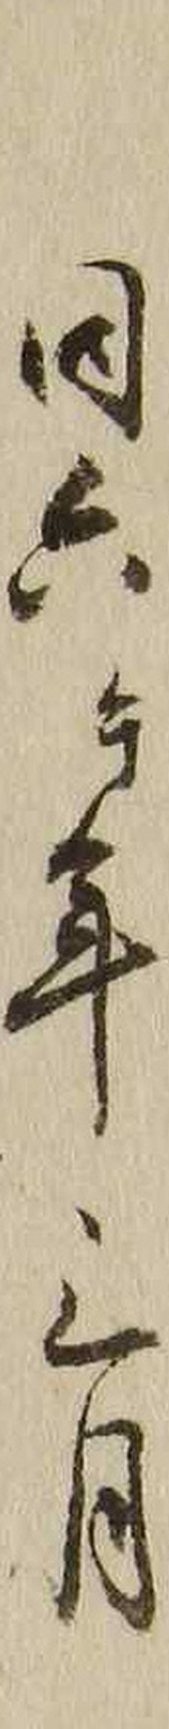一同六午年三月
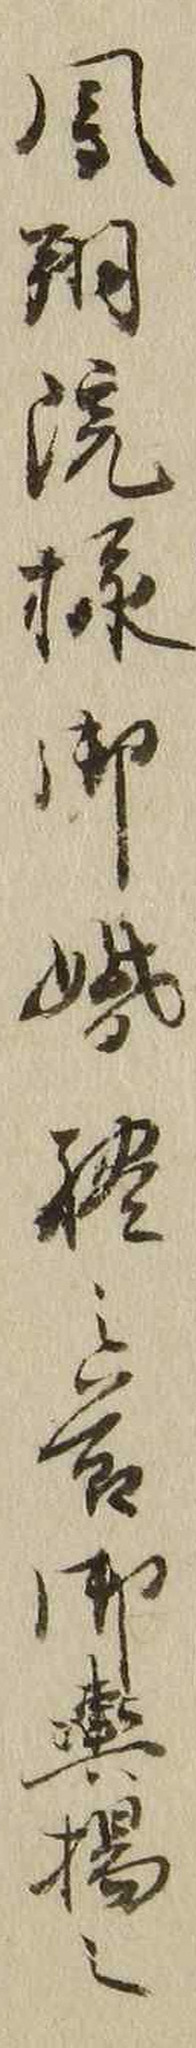鳳翔院様御婚礼之節御輿揚之
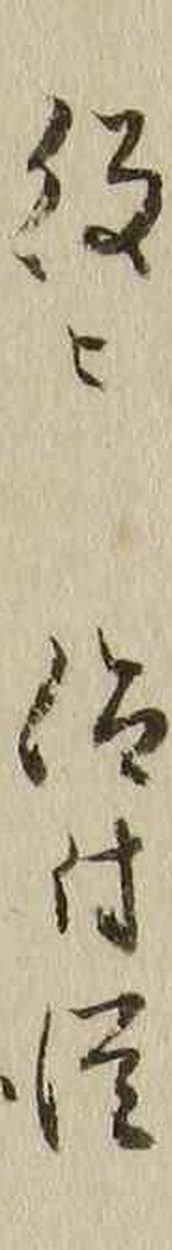役被仰付従
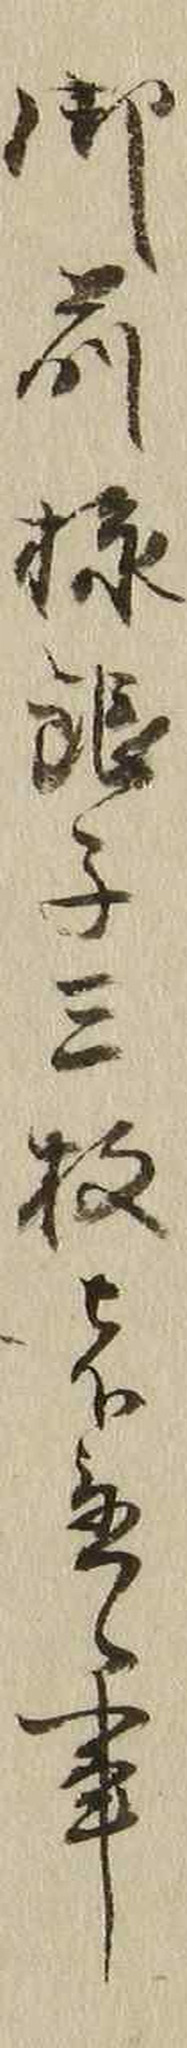御前様銀子三枚被下置候事
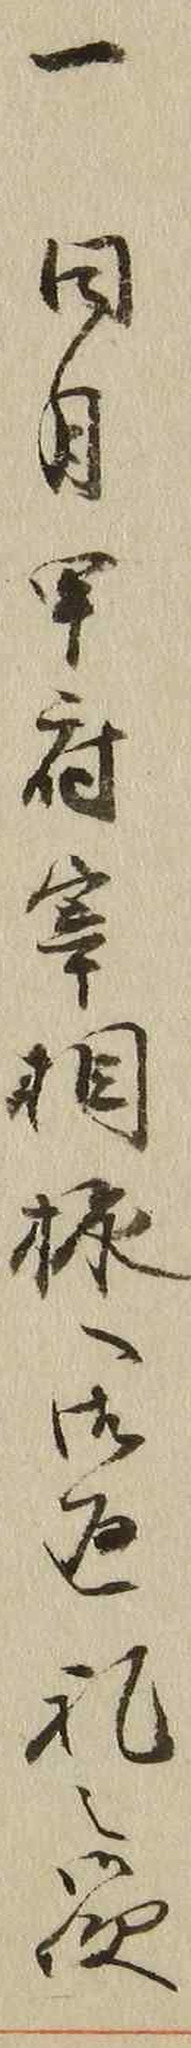一同月甲府宰相様へ御返礼之御使
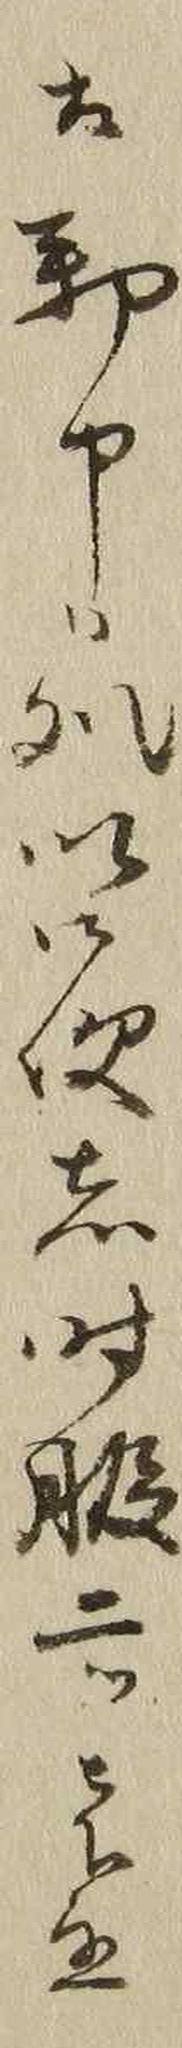相勤申候処以御使者時服二ツ被下置
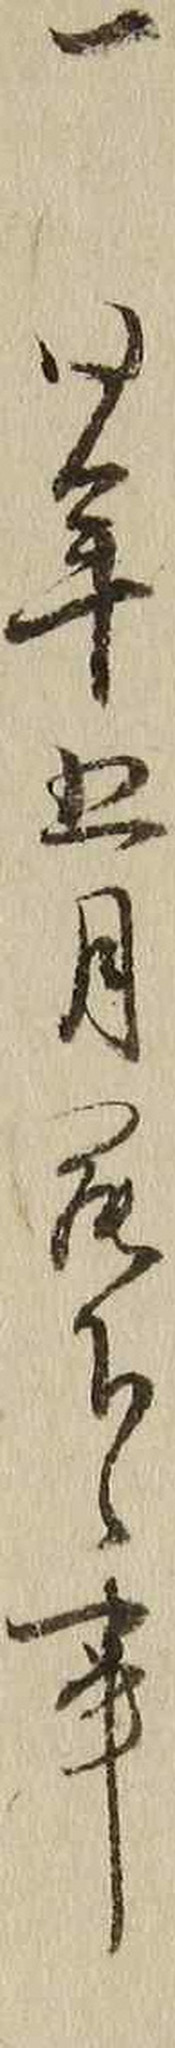一同年五月罷下候事
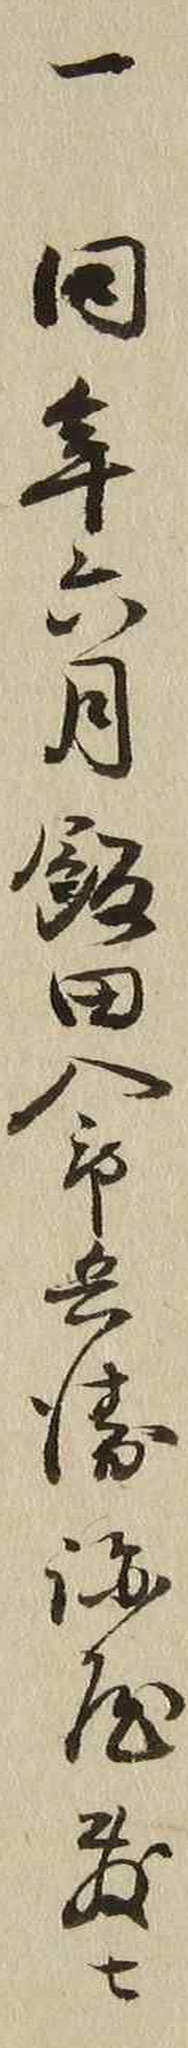一同年六月飯田八郎兵衛跡屋敷被
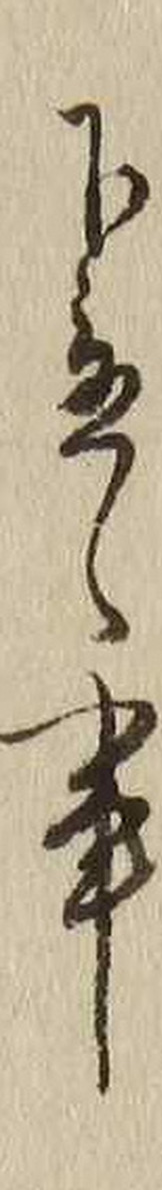下置候事
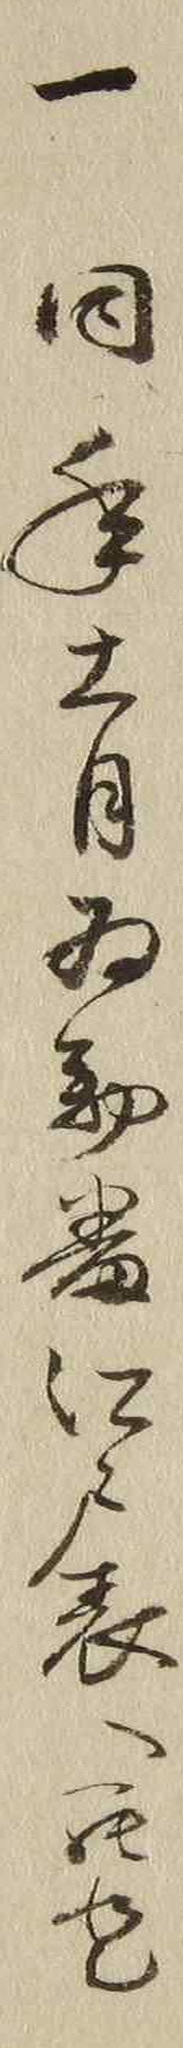一同年十一月為勤番江戸表へ罷登
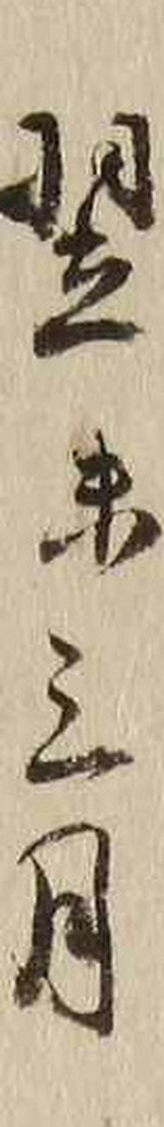翌未三月
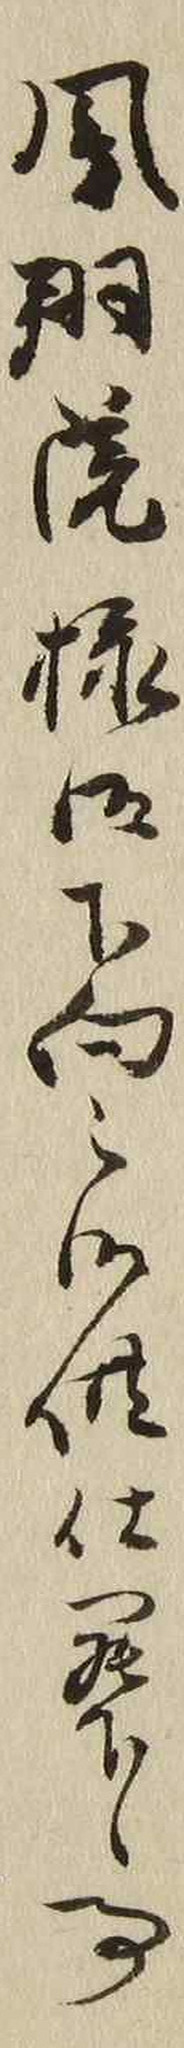鳳翔院様御下向之御供仕罷下候事
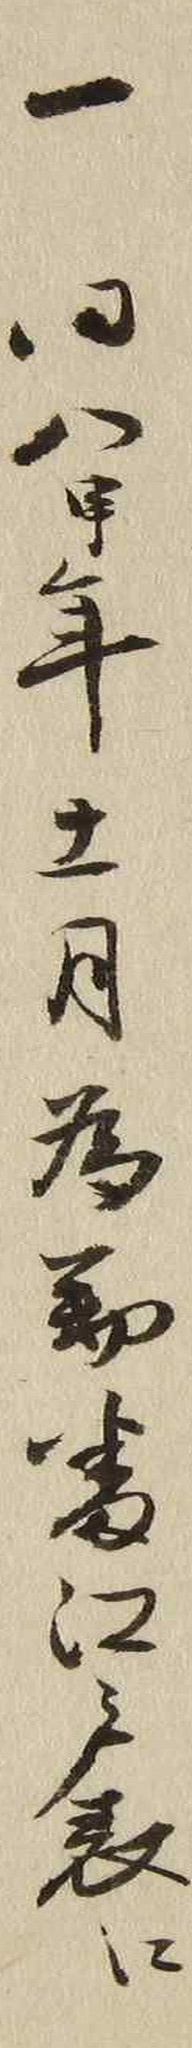一同八申年十一月為勤番江戸表江
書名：諸士系譜　巻之225　ま之部6
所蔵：会津若松市立会津図書館
